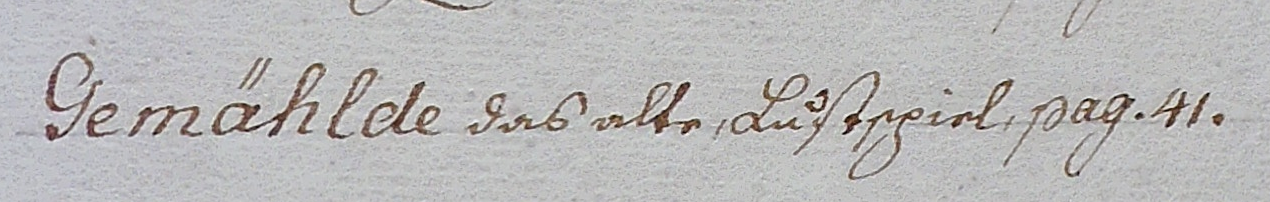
Gemählde das alte, Lustspiel, pag. 41.
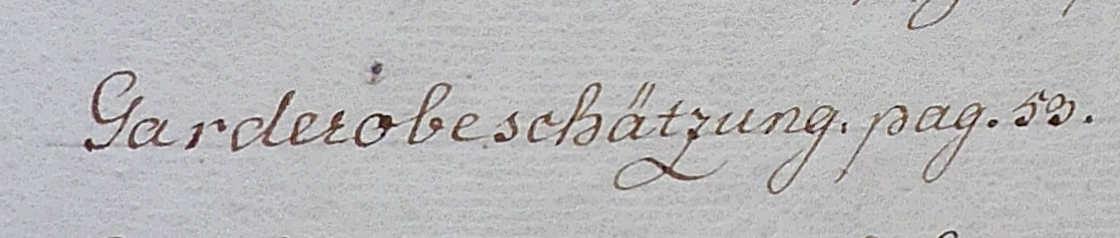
Garderobeschätzung. pag. 53.
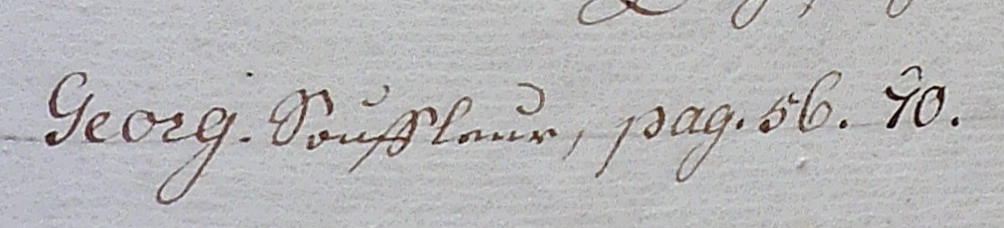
Georg. Souffleur, pag. 56. 70.
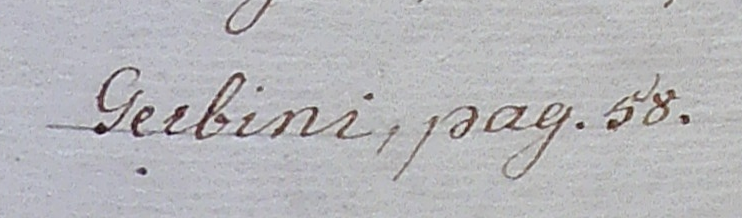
Gerbini, pag. 58.
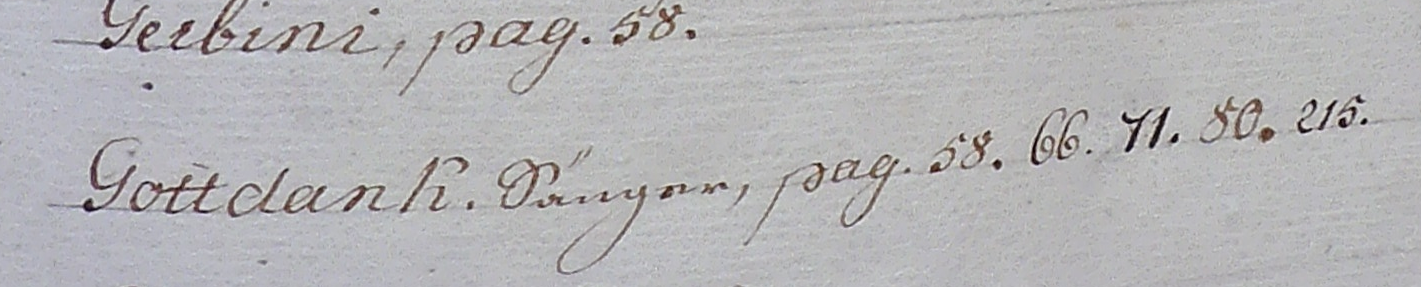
Gottdank. Sänger, pag. 58. 66. 71. 80. 215.
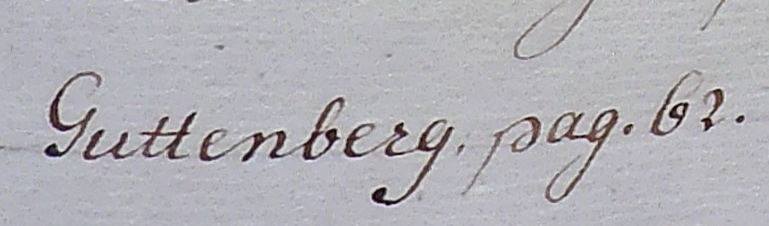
Guttenberg, pag. 62.
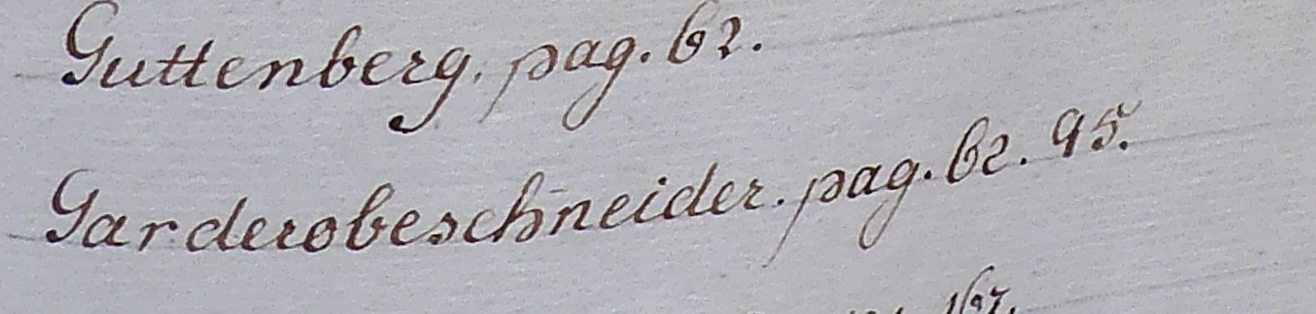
Garderobeschneider. pag. 62. 95.
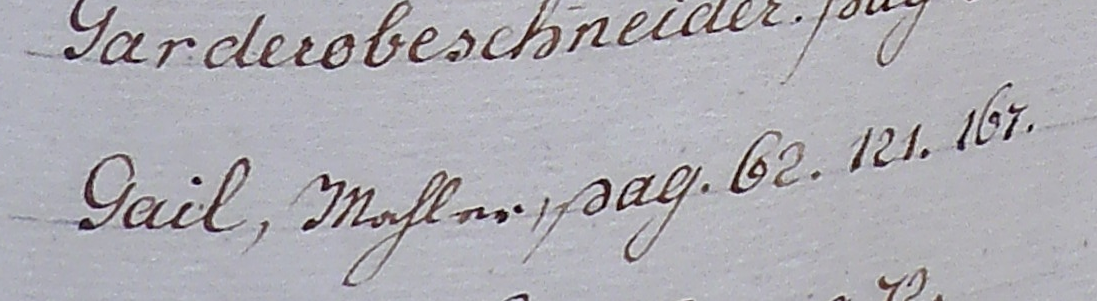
Gail, Mahler, pag. 62. 121. 167.
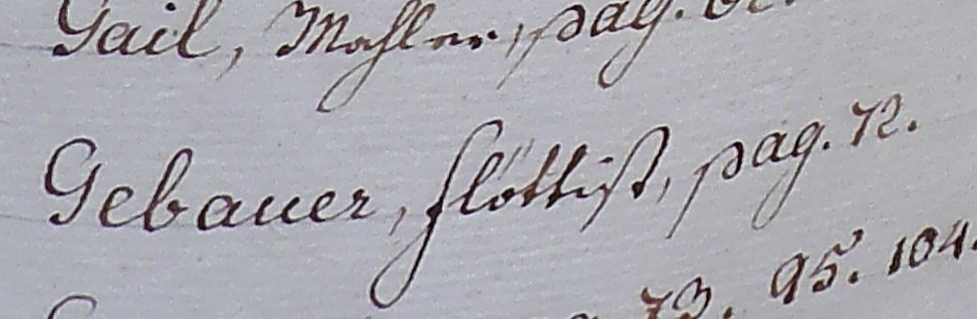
Gebauer, Flöttist, pag. 72.
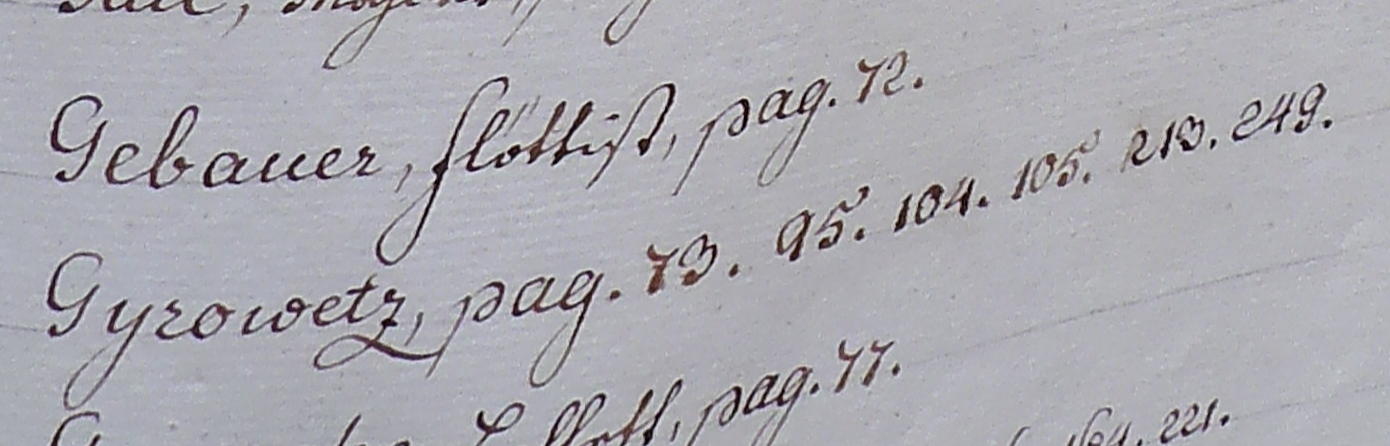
Gyrowetz, pag. 73. 95. 104. 105. 213. 249.
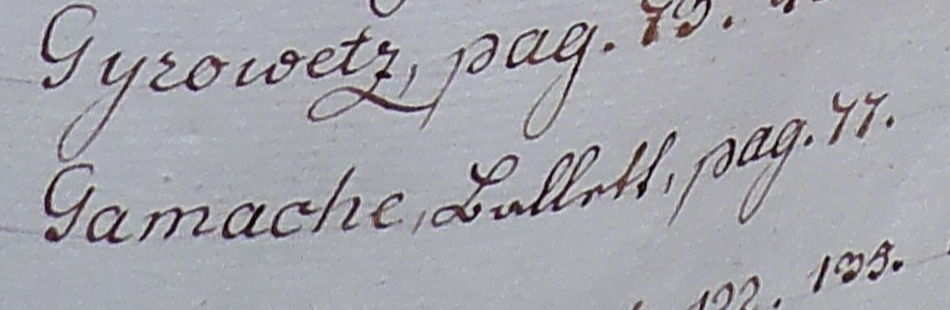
Gamache, Ballett, pag. 77.
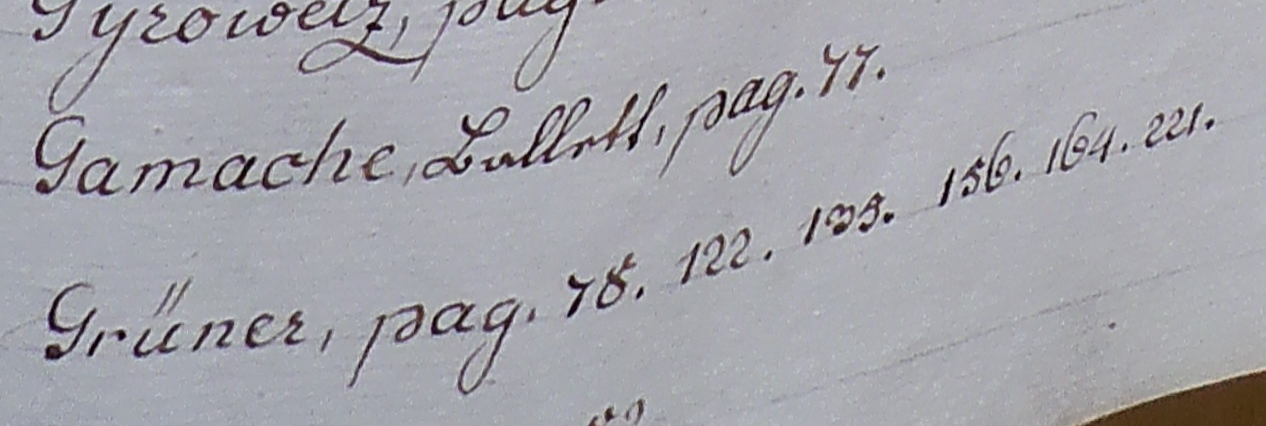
Grüner, pag. 78. 122. 135. 156. 164. 221.
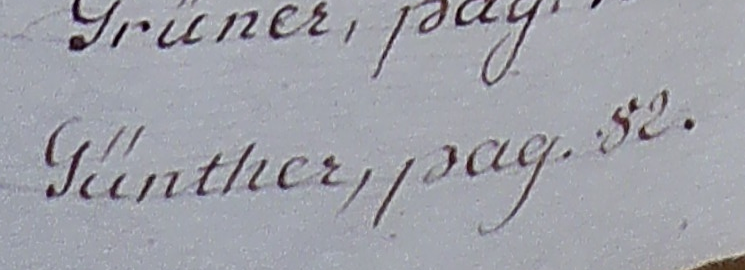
Günther, pag. 82.
